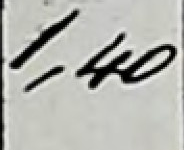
1,40
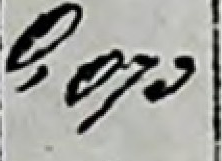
0,073
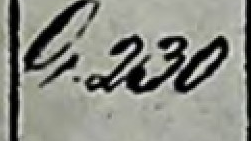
0,230
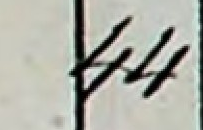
44
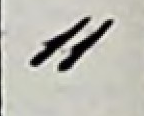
11
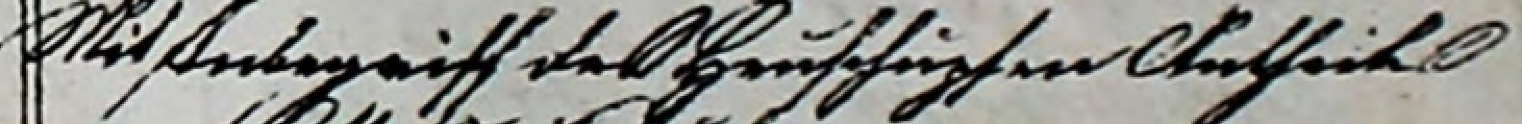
Mit Inbegriff des Hauschupsen Antheiles
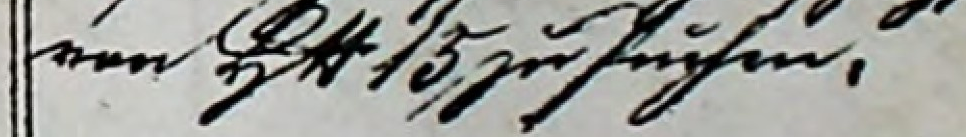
von H? 15 zu Puchen.
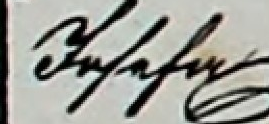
Josefa
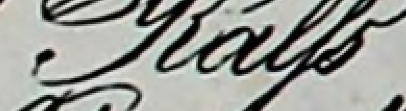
Kalss
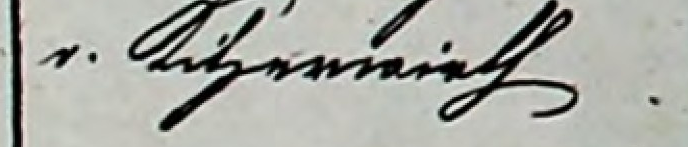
v. Kitzerwirth
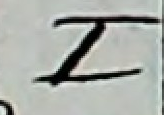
I
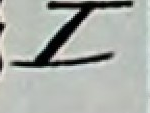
I
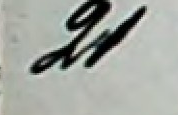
21
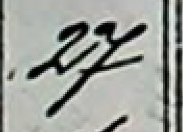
27
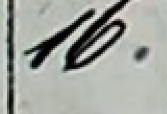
16
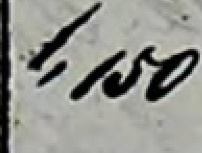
1,150
